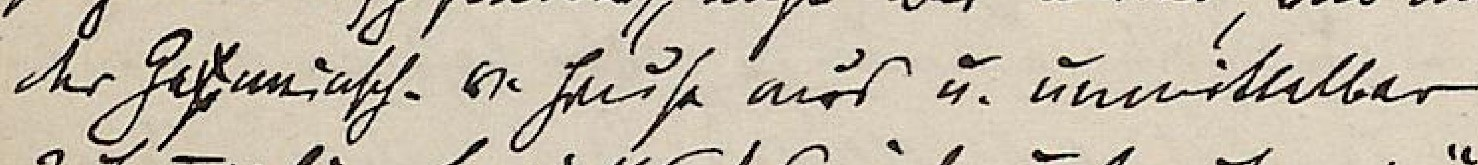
der Gesmeinsch. v. Hause aus u. unmittelbar
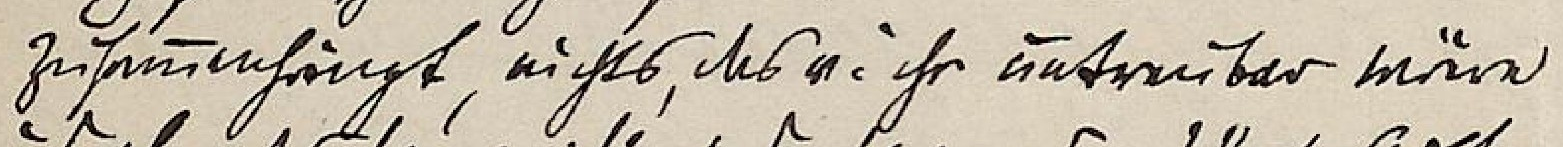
zusammenhängt nichts, das v ihr untrennbar wäre
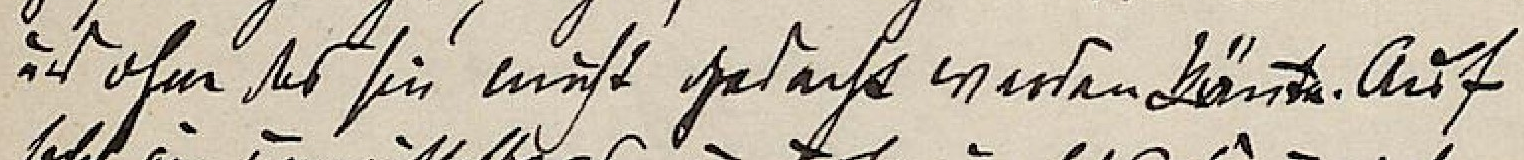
und ohne des sie nicht gedacht werden könte. Auf
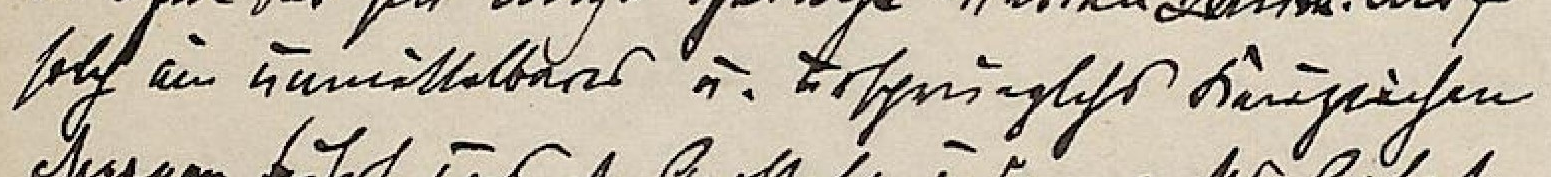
solch ein unmittelbares u. ursprüngliches Kenzeichen
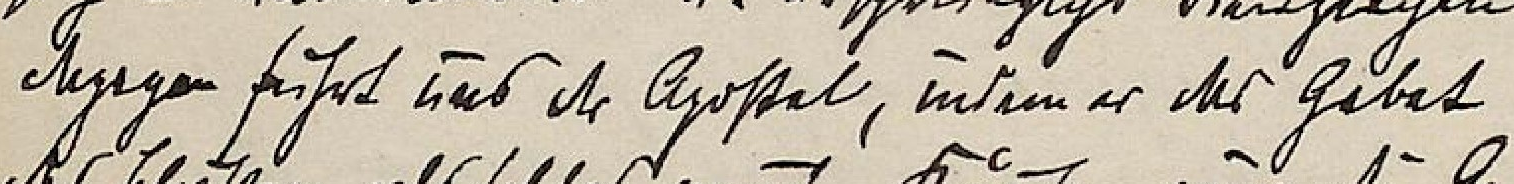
dagegen führt uns der Apostel, indem er das Gebet
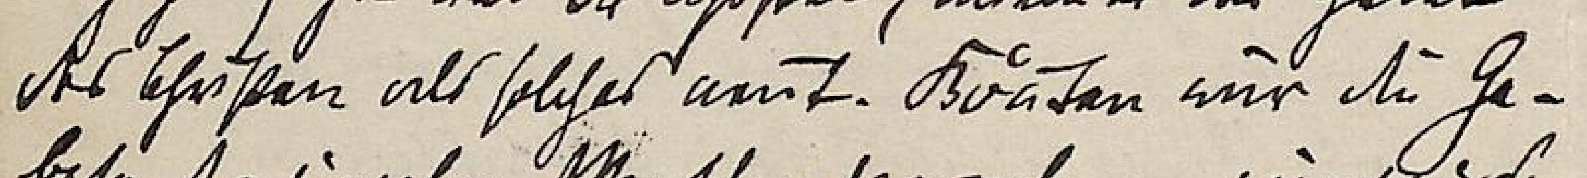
das Christen als solches nennt. Könnten wir die Ge¬
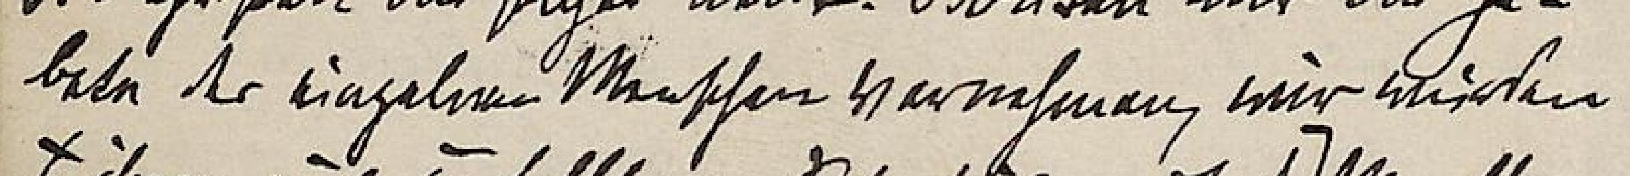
bete der einzelnen Menschen vernehmen, wir würden
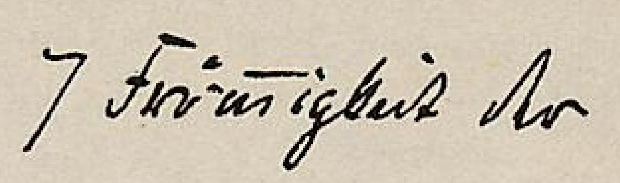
] Frömigkeit der
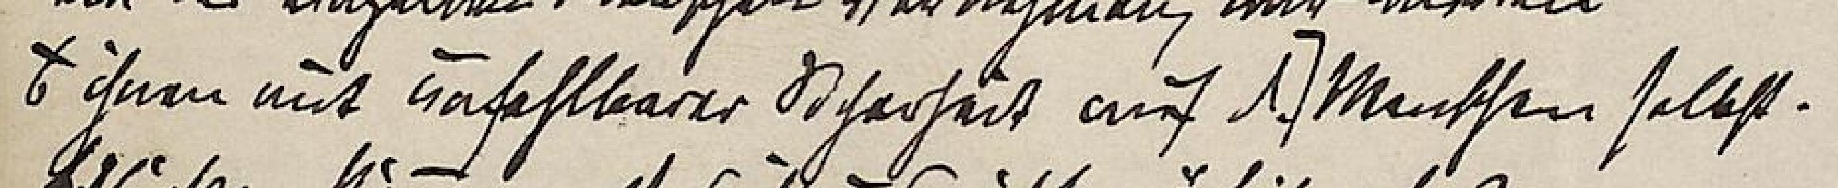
s ihnen mit unfehlbarer Sicherheit auf d.] Menschen selbst.
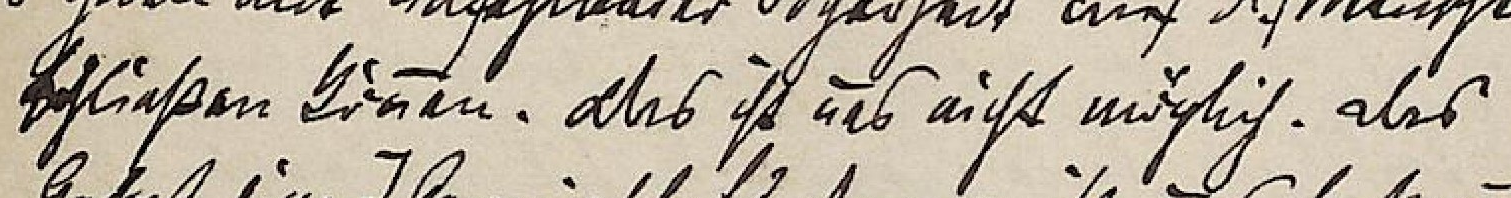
schließen könen. Das ist uns nicht möchlich. Das
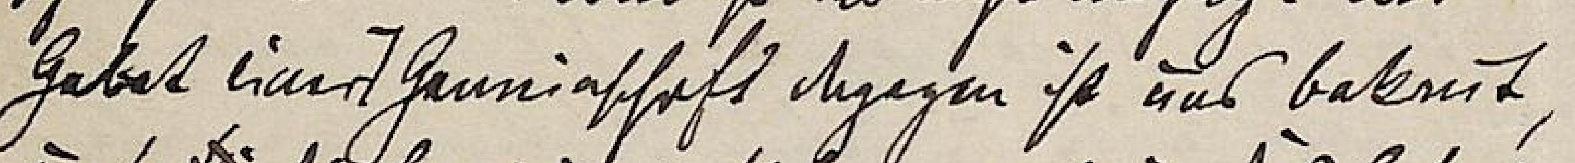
Gebet einer Gemeinschaft dagegen ist uns bekannt,
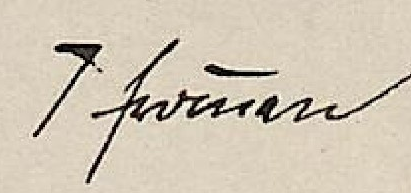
fromen,
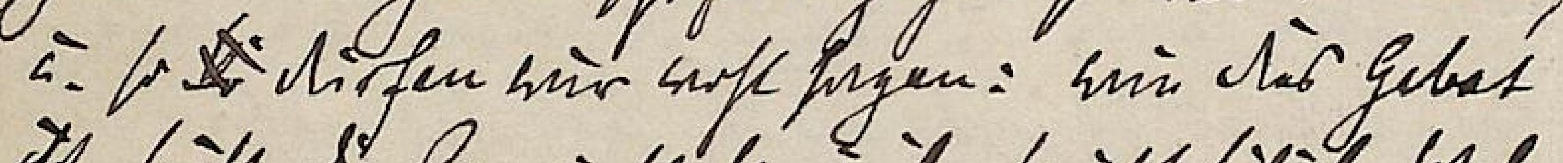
u. so kö dürfen wir wohl sagen: wie dies Gebet
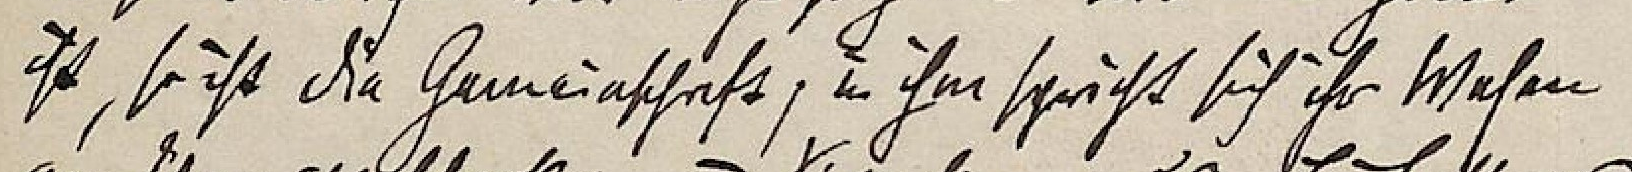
ist, so ist die Gemeinschaft, in ihm spricht sich ihr Wesen
